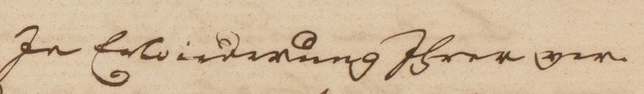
In Erwiederung Ihrer ver-
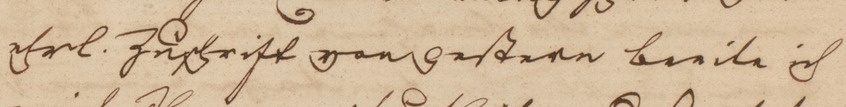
ehrl. Zuschrift von gestern beeile ich
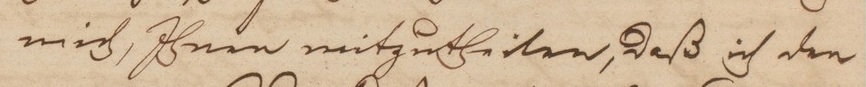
mich, Ihnen mitzutheilen, daß ich den
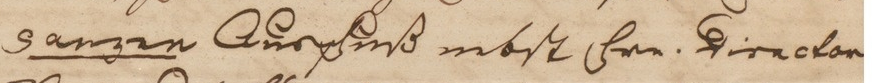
ganzen Ausschuß nebst dem Hrn. Director
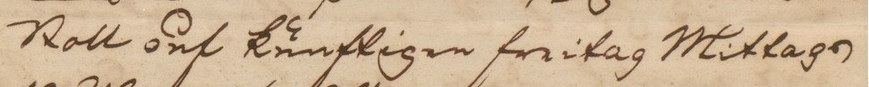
Stoll auf künftigen Freitag Mittags
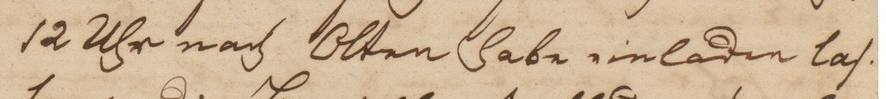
12 Uhr nach Olten habe einladen las-
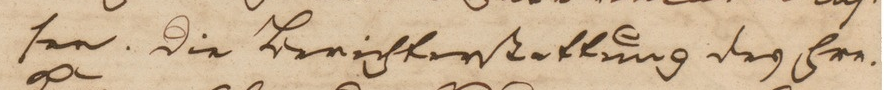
sen. Die Berichterstattung des Hrn.
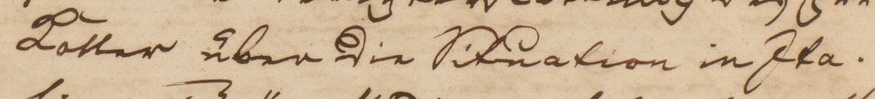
Koller über die Situation in Ita-
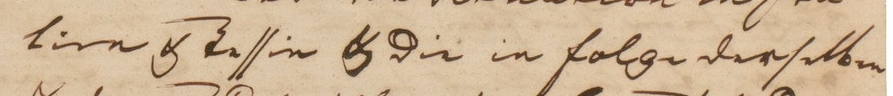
lien & Tessin & die in Folge derselben
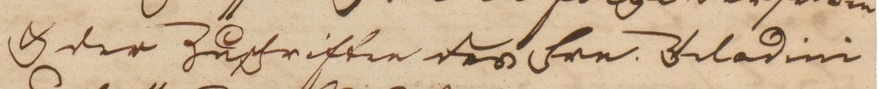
& der Zuschriften des Hrn. Veladini
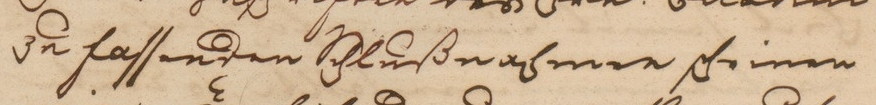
zu fassenden Schlußnahmen scheinen
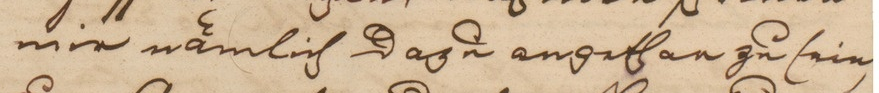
mir nämlich dazu angethan zu sein,
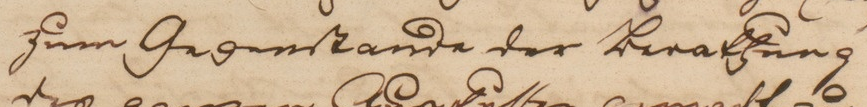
zum Gegenstande der Berathung
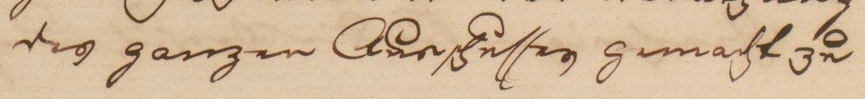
des ganzen Ausschusses gemacht zu
